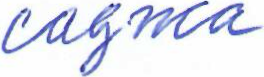саджа
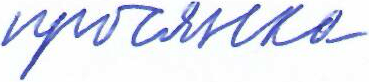просянка
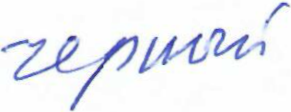черный
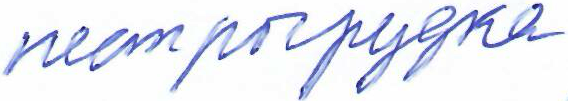пестрогрудка
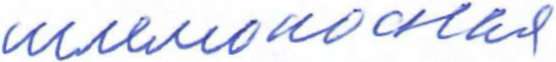шлемоносная
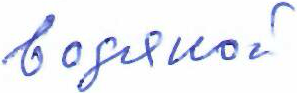водяной
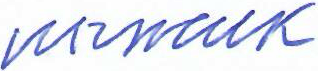пыжик
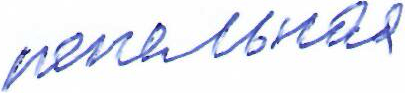пепельная
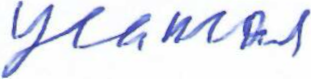усатая
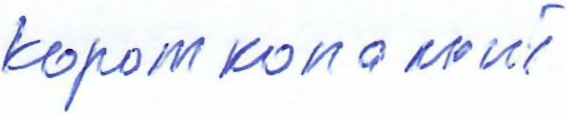короткопалый
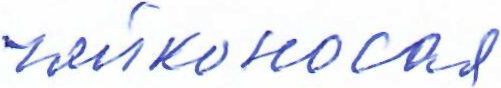чайконосая
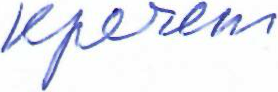кречет
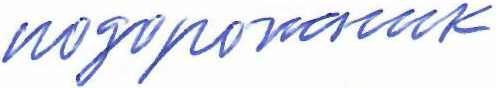подорожник
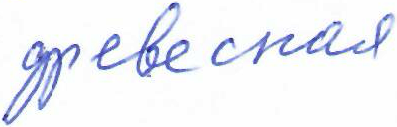древесная
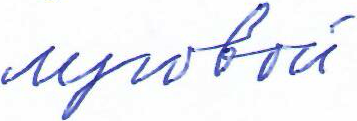луговой
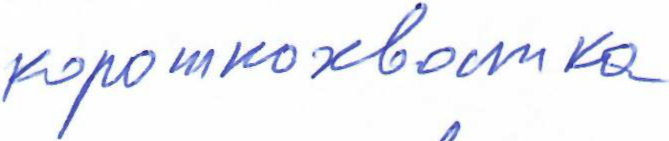короткохвостка
